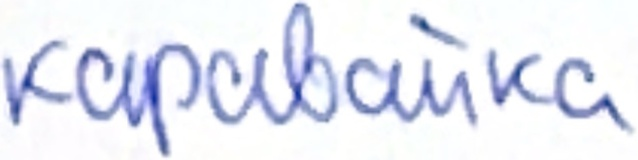каравайка
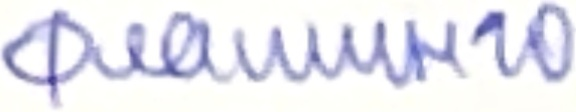фламинго
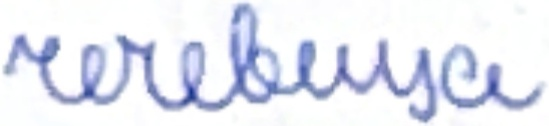чечевица
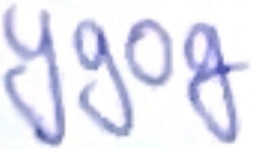удод
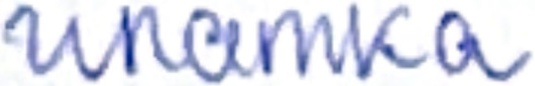ипатка
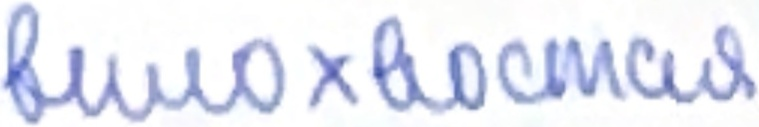вилохвостая
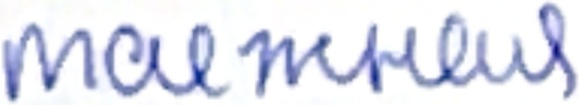таежная
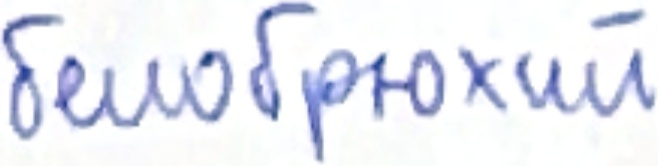белобрюхий
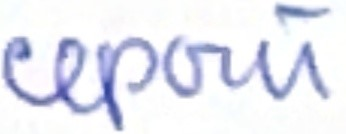серый
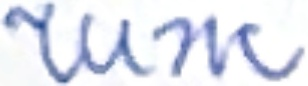чиж
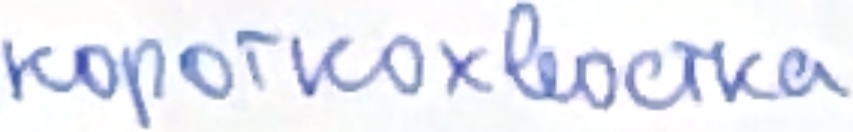короткохвостка
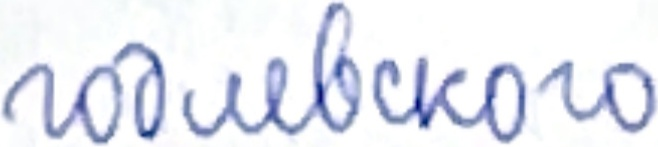годлевского
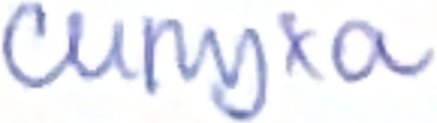сипуха
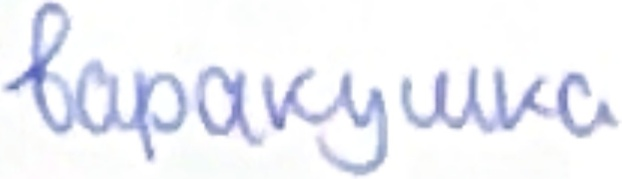варакушка
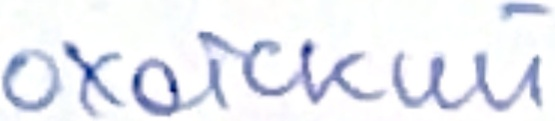охотский
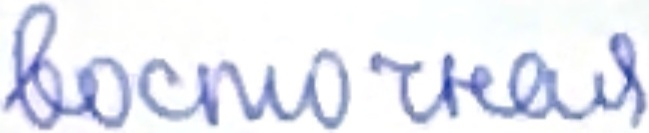восточная
